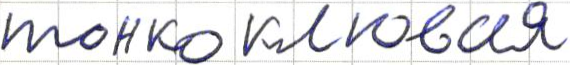тонкоклювая
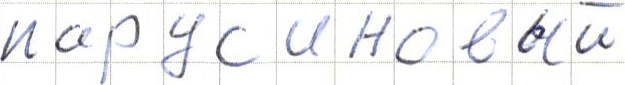парусиновый
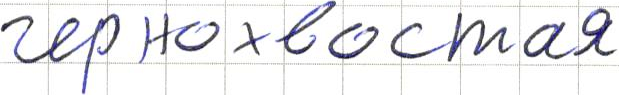чернохвостая
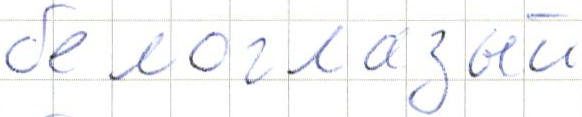белоглазый
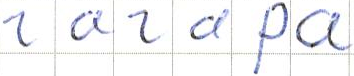гагара
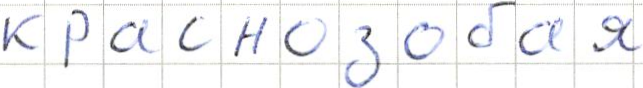краснозобая
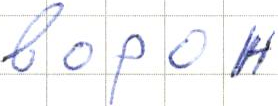ворон
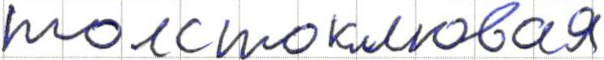толстоклювая
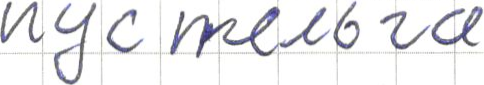пустельга
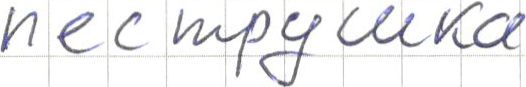пеструшка
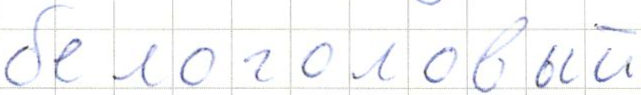белоголовый
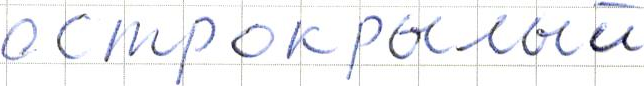острокрылый
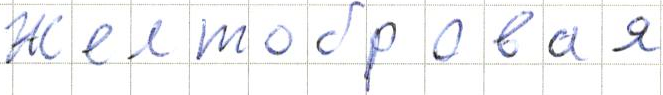желтобровая
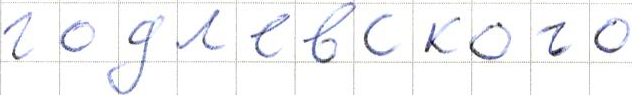годлевского
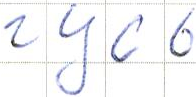гусь
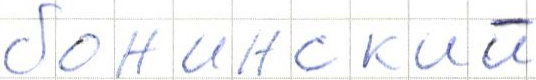бонинский
